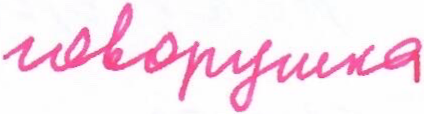говорушка
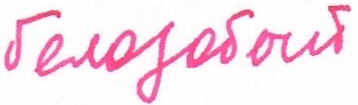белозобый
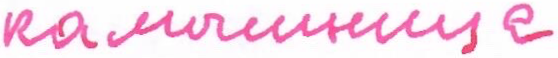камышница
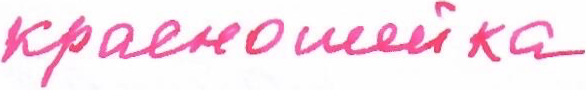красношейка
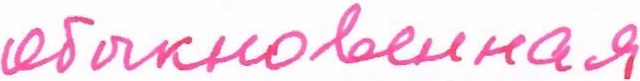обыкновенная
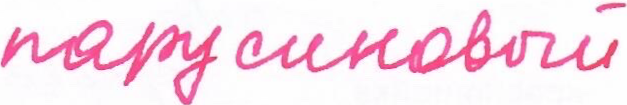парусиновый
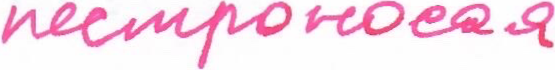пестроносая
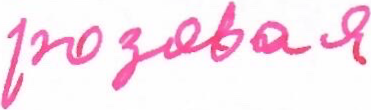розовая
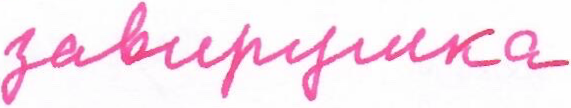завирушка
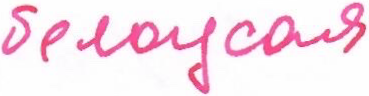белоусая
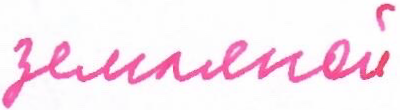земляной
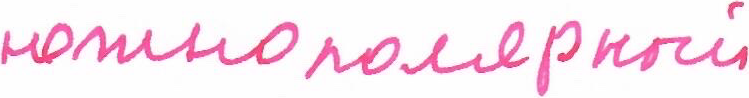южнополярный
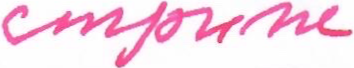стриж
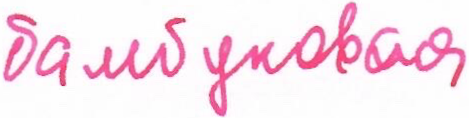бамбуковая
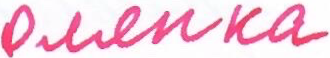оляпка
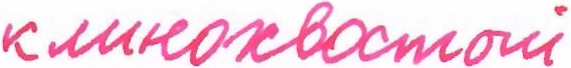клинохвостый
